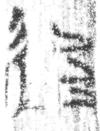○（錦）
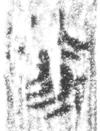○（繸）
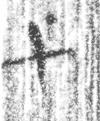十
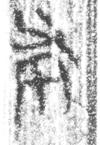布
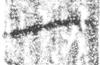一
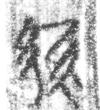絲
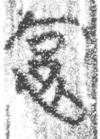裛
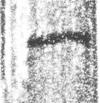一
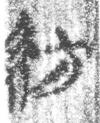紡
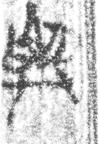與
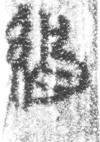絹
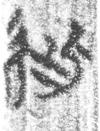紫
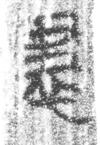裏
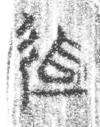組
